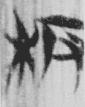板
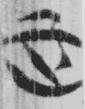正
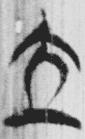立
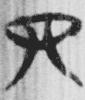四
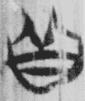向
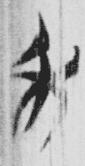禾（和）
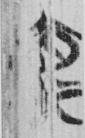褱（懷）
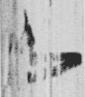㠯（以）
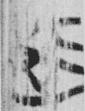逨（來）
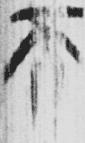天
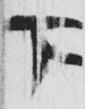下
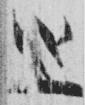之
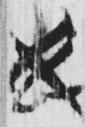民
